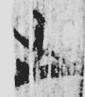之
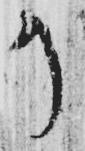人
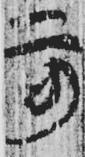可
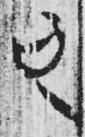也
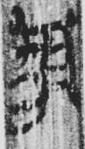○（聞）
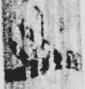之
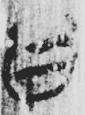曰
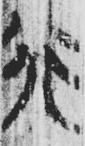行
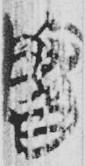險
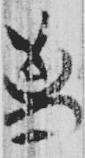至（致）
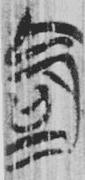命
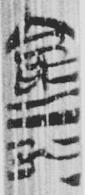滄
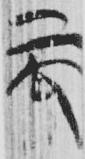而
